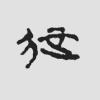征
